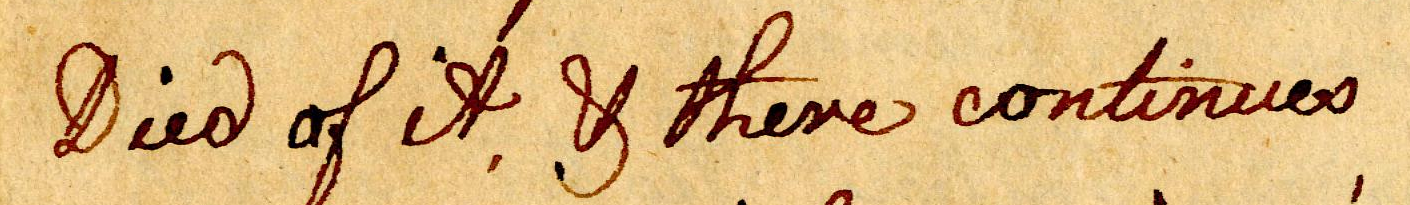Died of it, & there continues
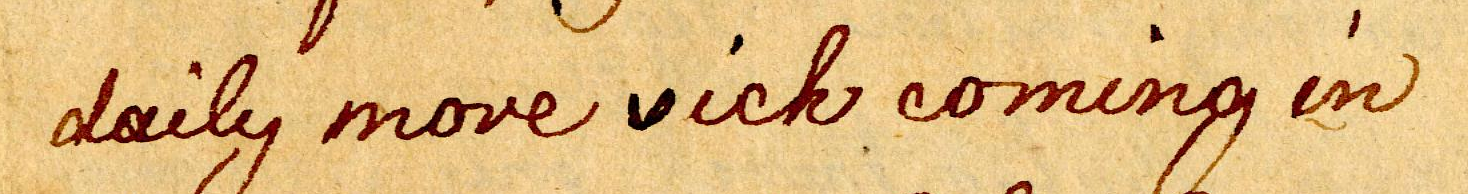daily more sick coming in
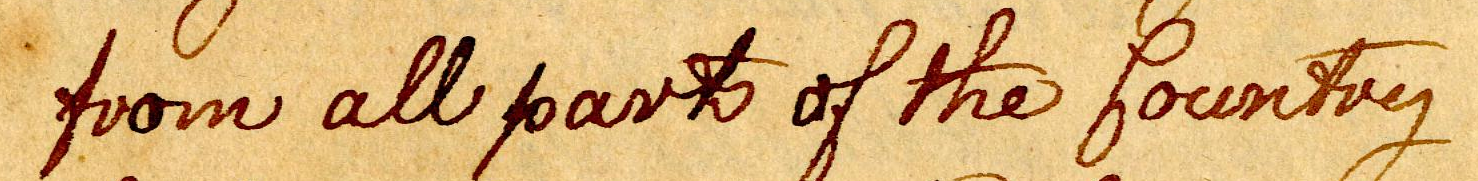from all parts of the Country
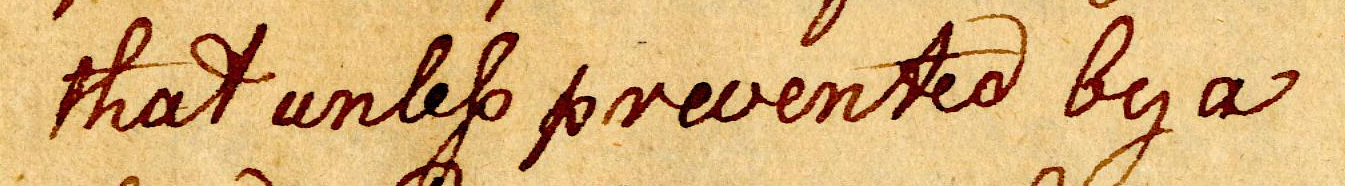that unless prevented by a
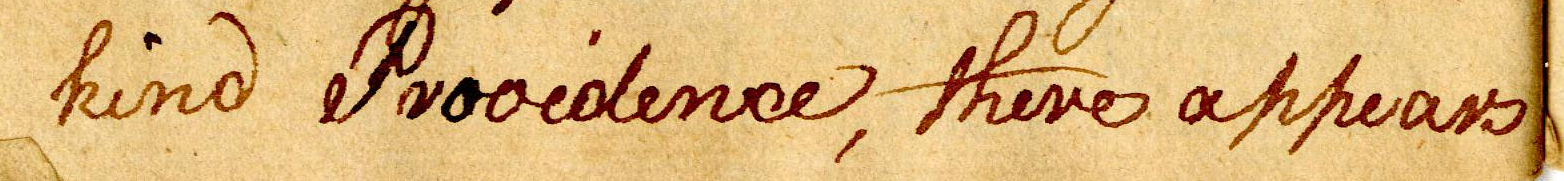kind Providence, there appears
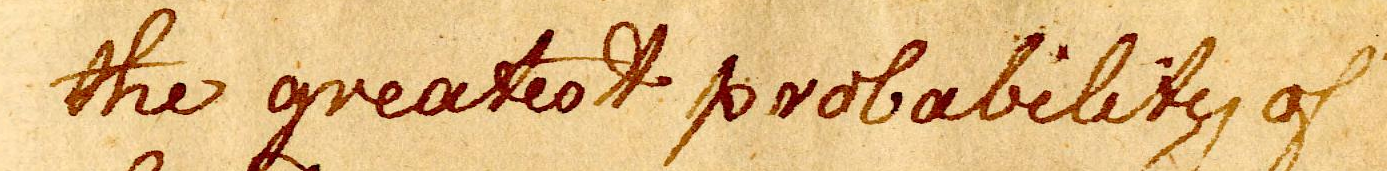the greatest probability of
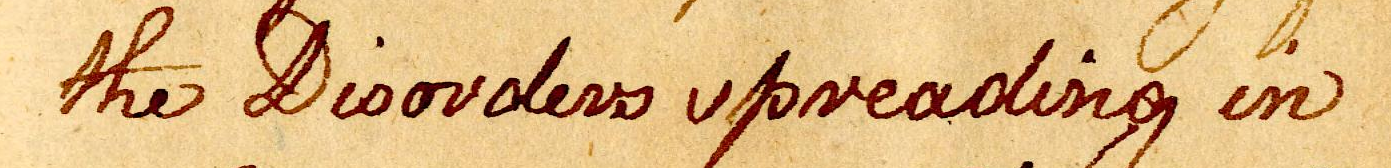the Disorders spreading in
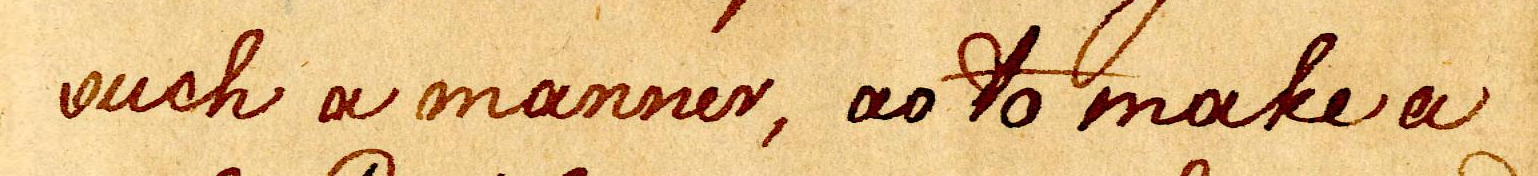such a manner, as to make a
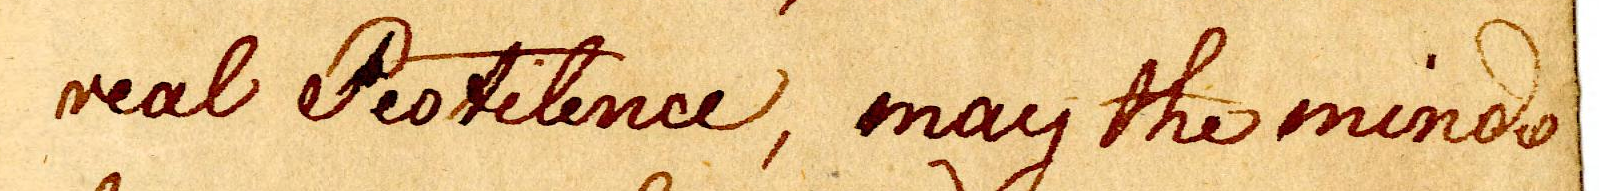real Pestilence, may the minds
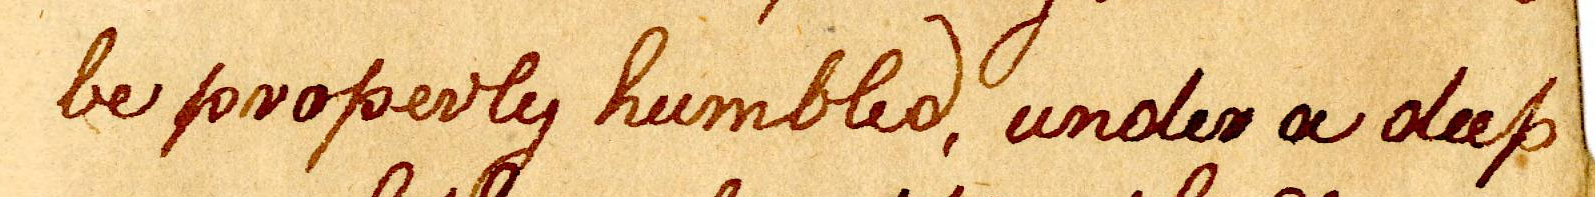be properly humbled, under a deep
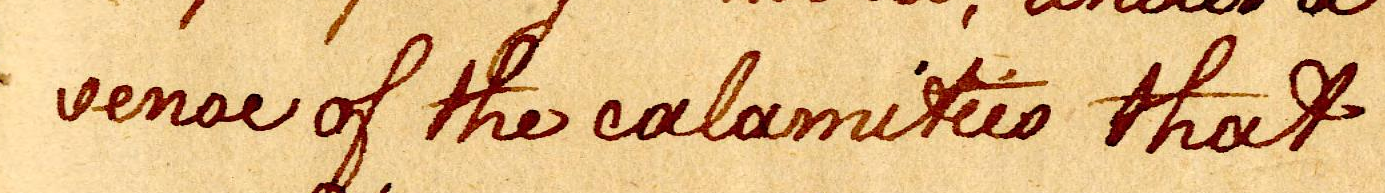sense of the calamities that
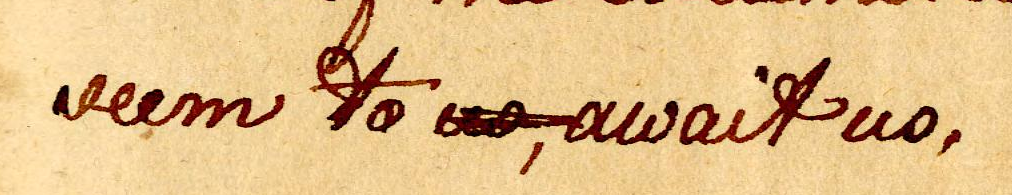seem to [us], await us.
